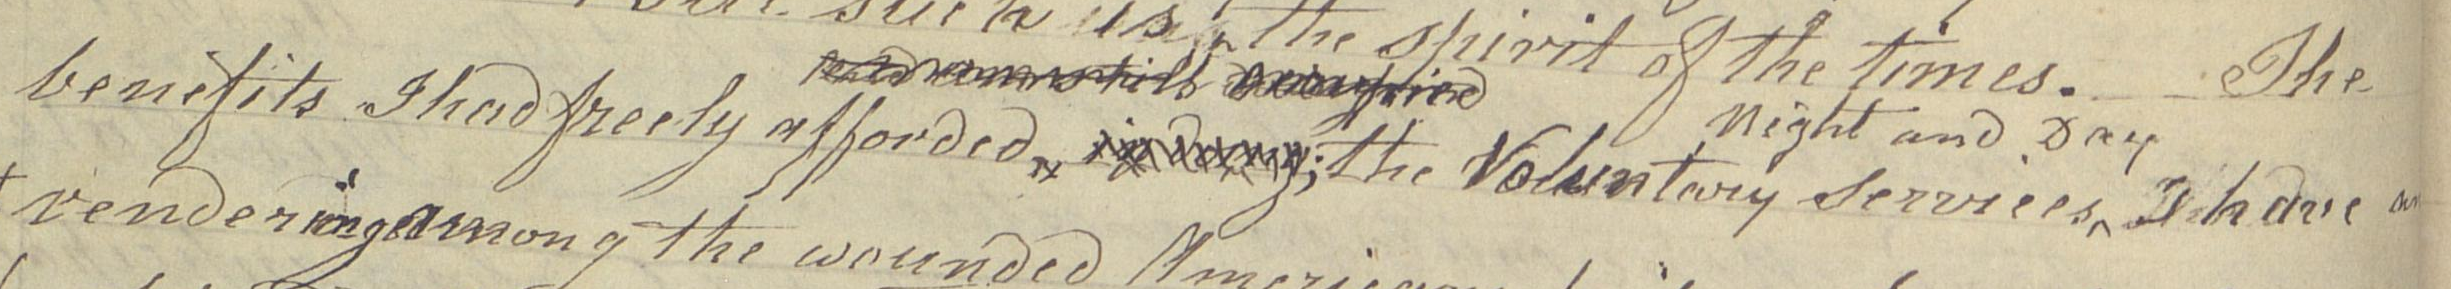benefits I had freely afforded, ^ in doing the Voluntary Services ^ I have
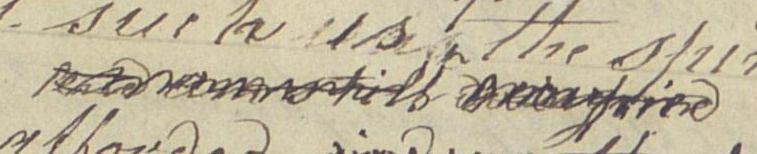[__]d[____]ti[__] [_______]d
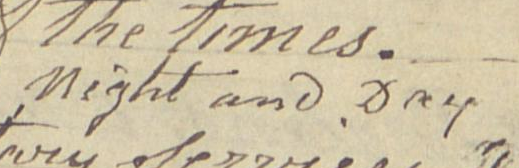night and day
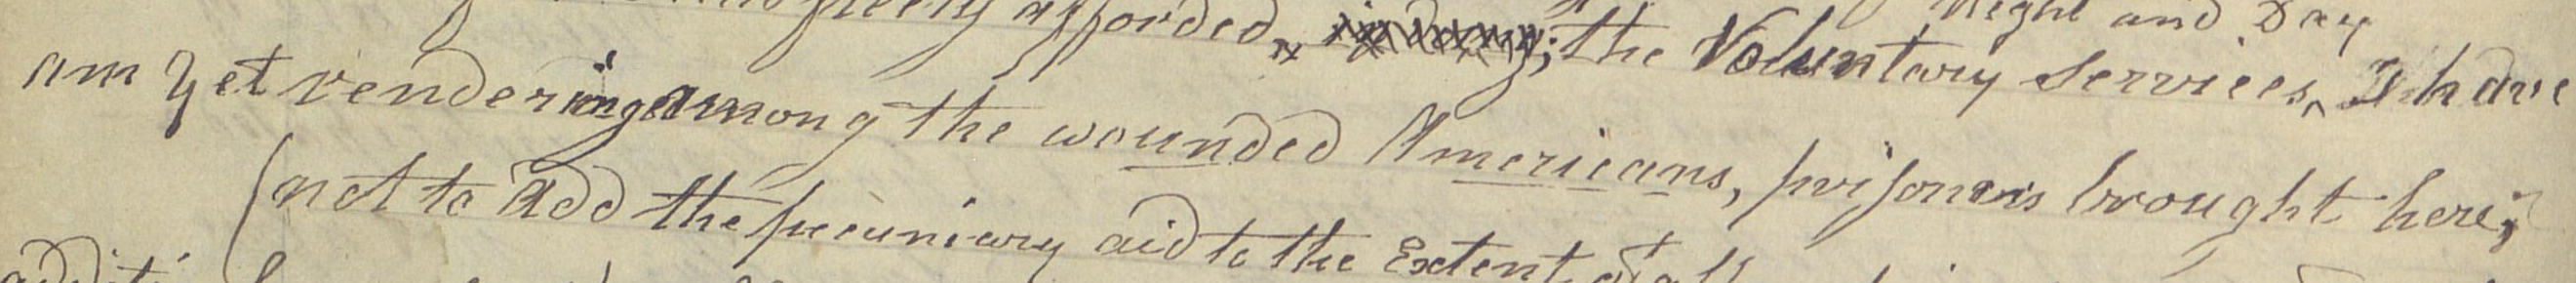am yet rendering among the wounded Americans, prisoners brought here;
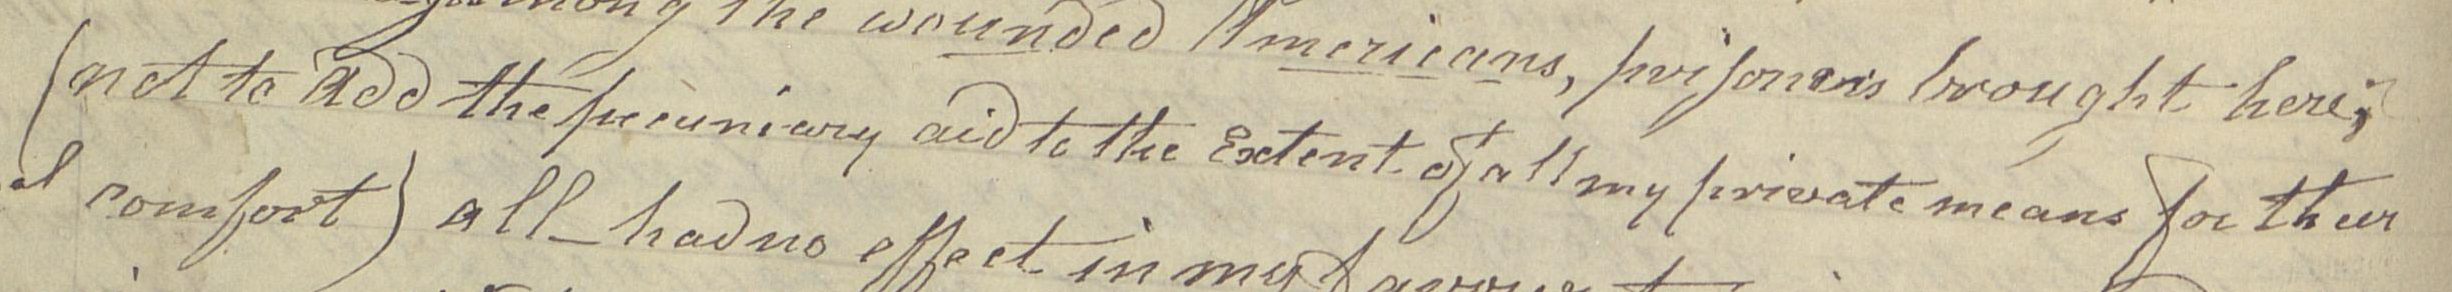(not to add the pecuniary aid to the Extent of all my private means for their
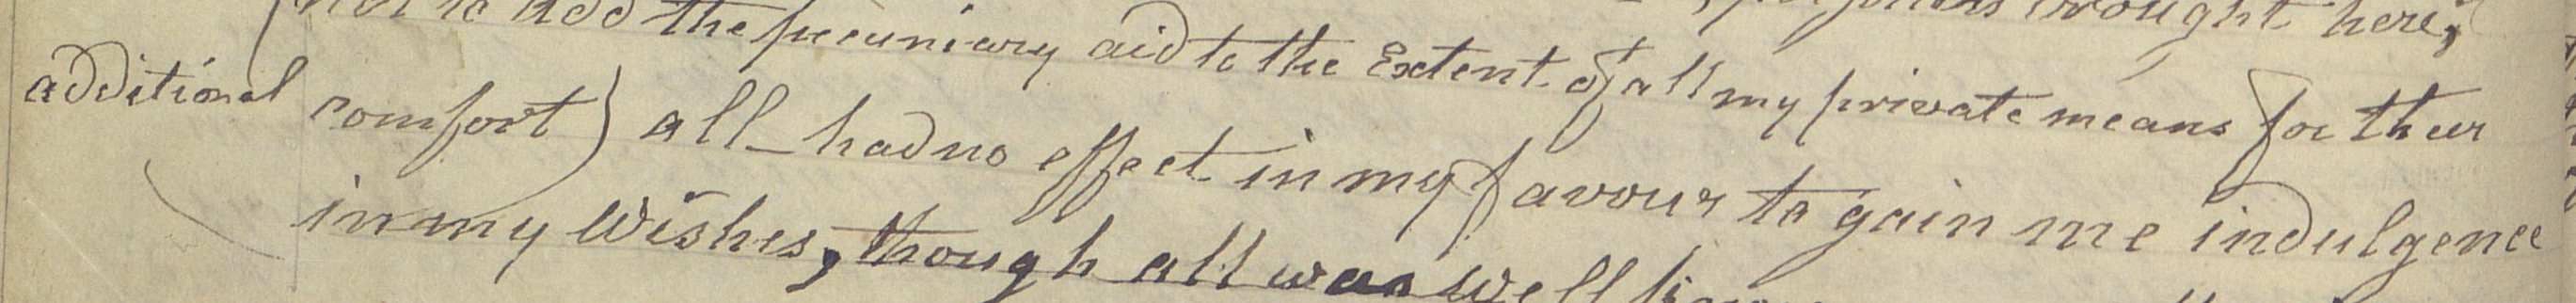additional comfort) all had no effect in my favour to gain me indulgence
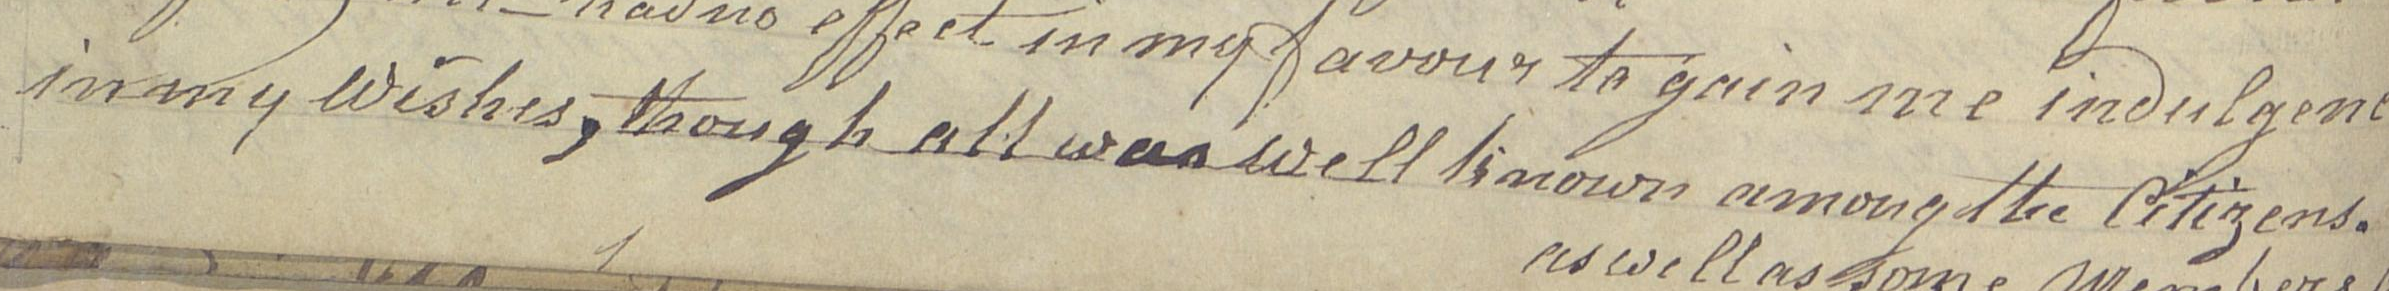in my Wishes, though all was well known among the Citizens.
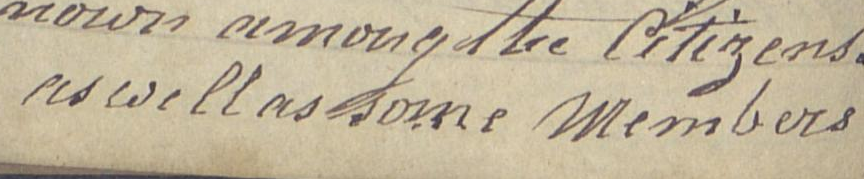as well as some members
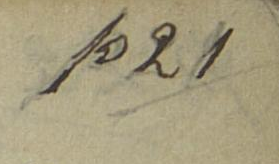p 21
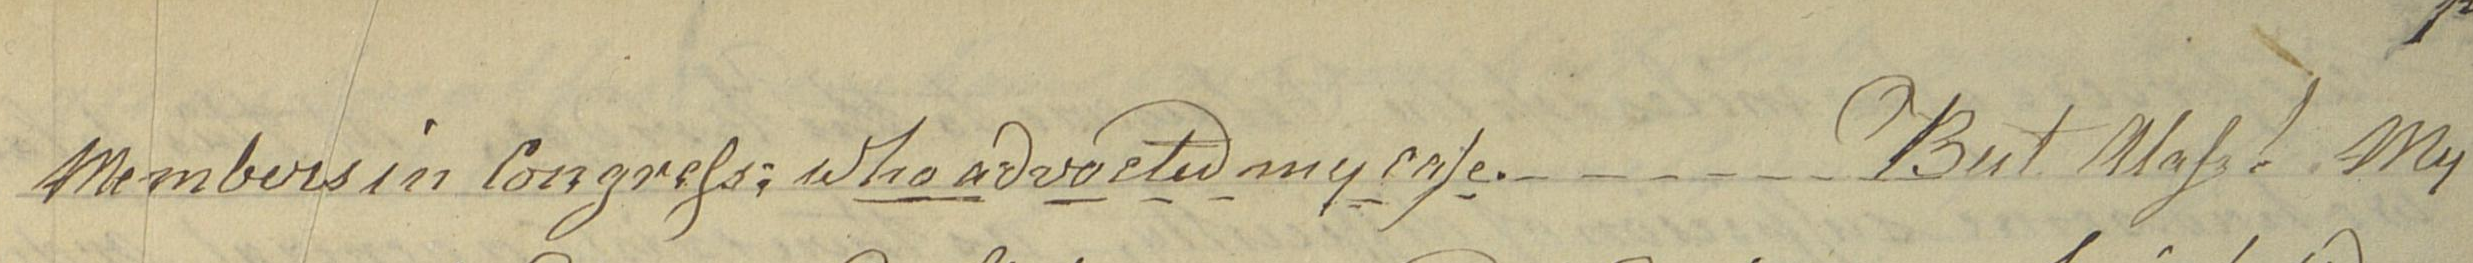Members in Congress; who advocted my case. But Alas! my
